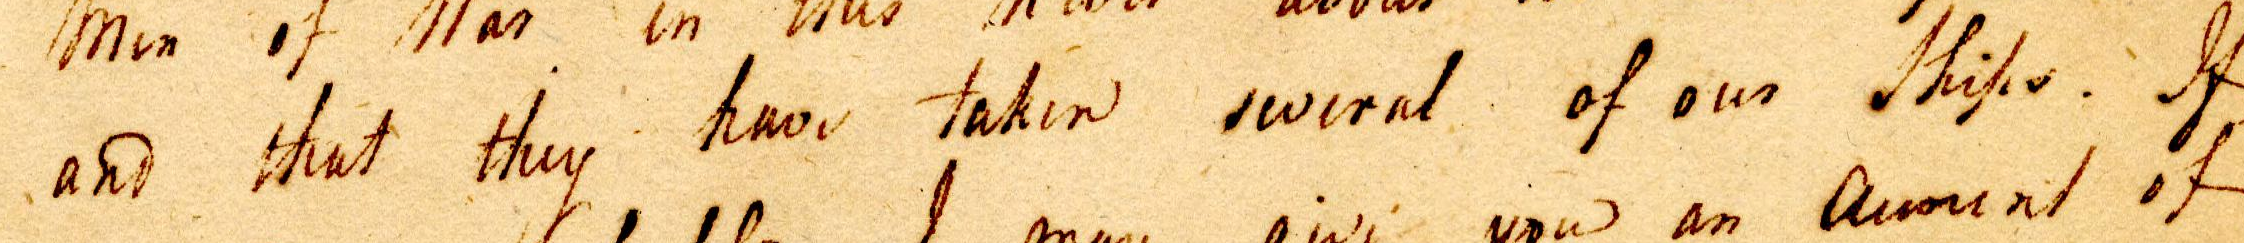and that they have taken several of our Ships. If
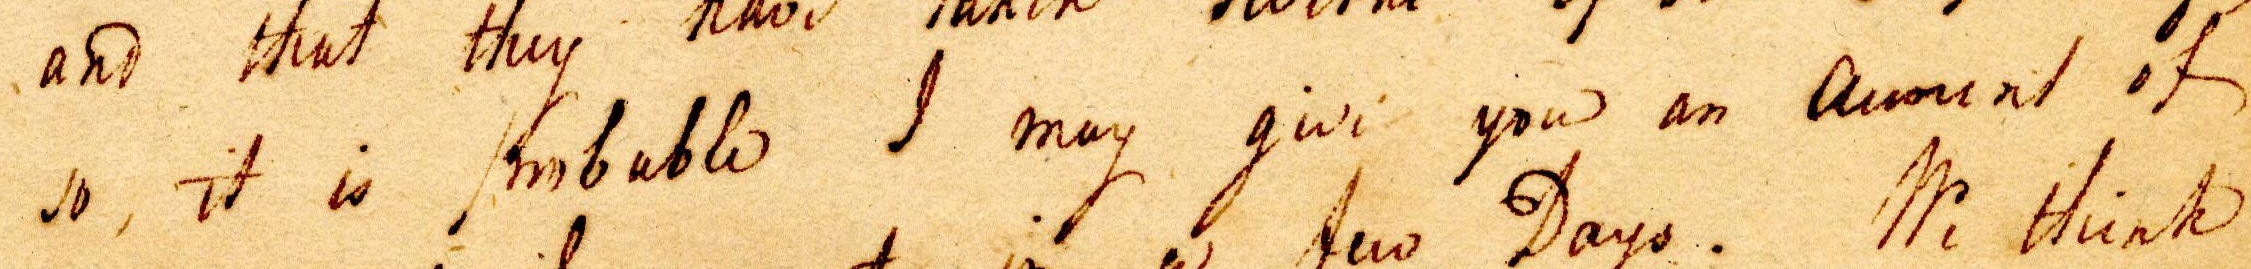so, it is probable I may give you an Account of
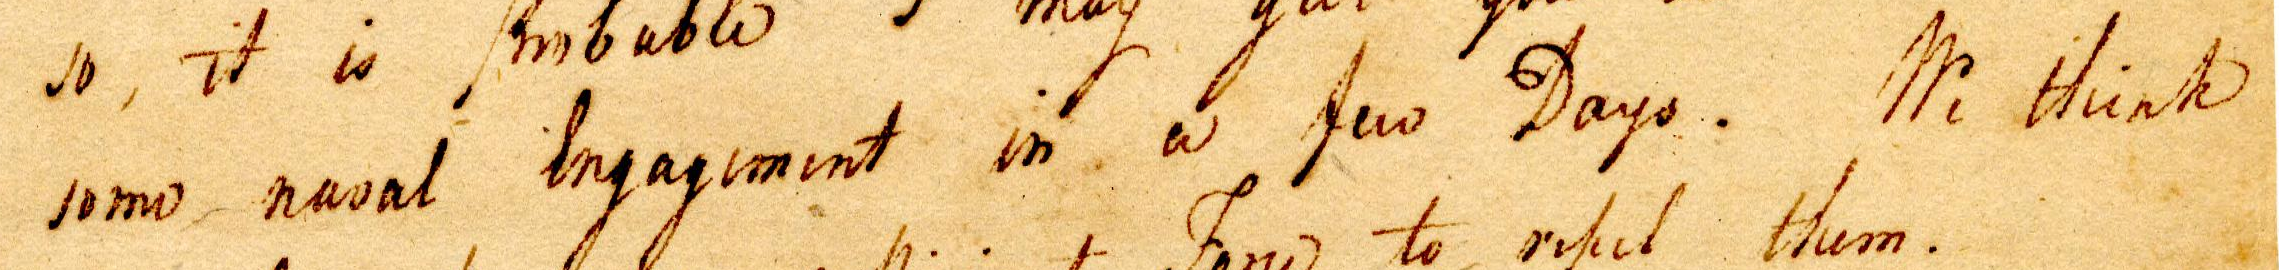some naval Engagement in a few Days. We think
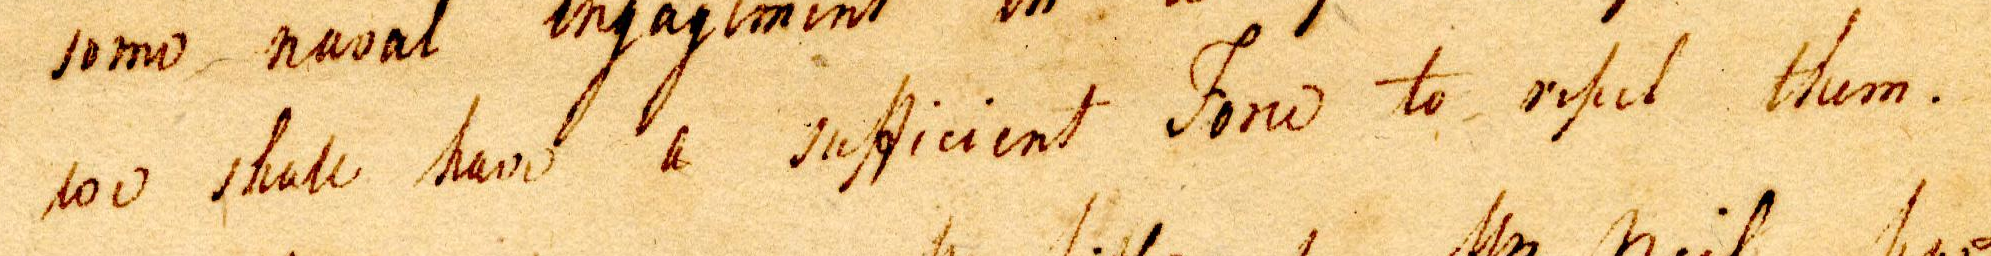we shall have a sufficient Force to repel them.
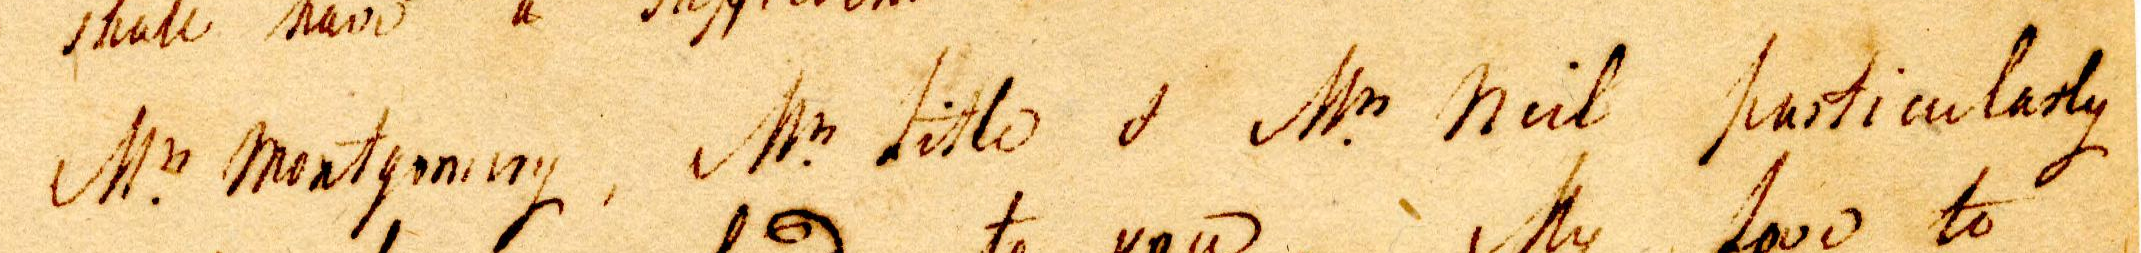M^r. Montgomery, M^r. Litle & M^r Neil particularly
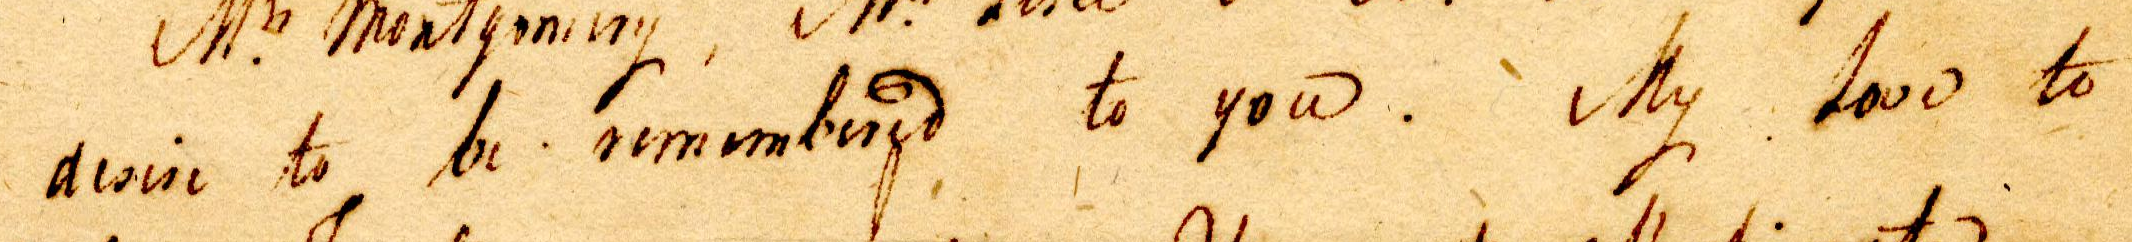desire to be remembered to you. My Love to
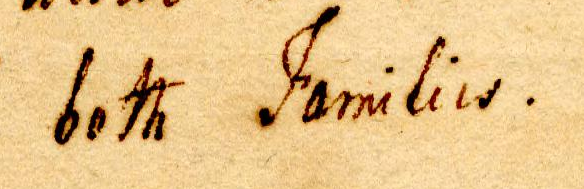both Families.
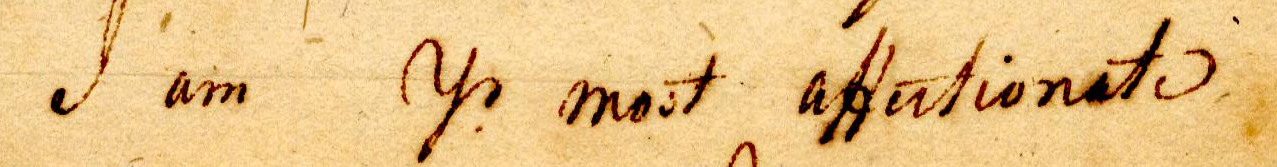I am Y^r most affectionate
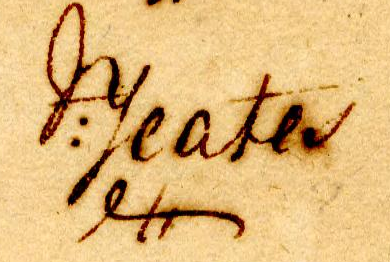J: Yeates
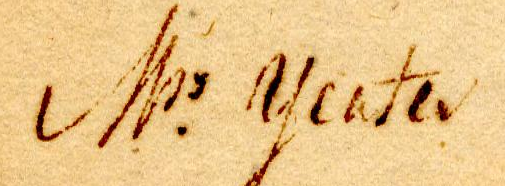M^rs. Yeates
